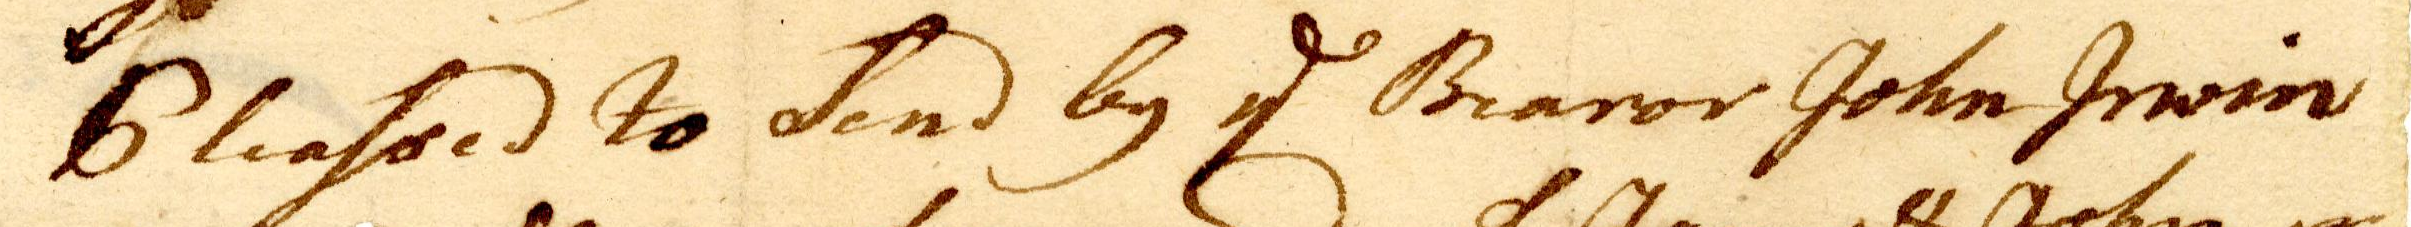Pleassed to send by y^e Bearor John Irwin
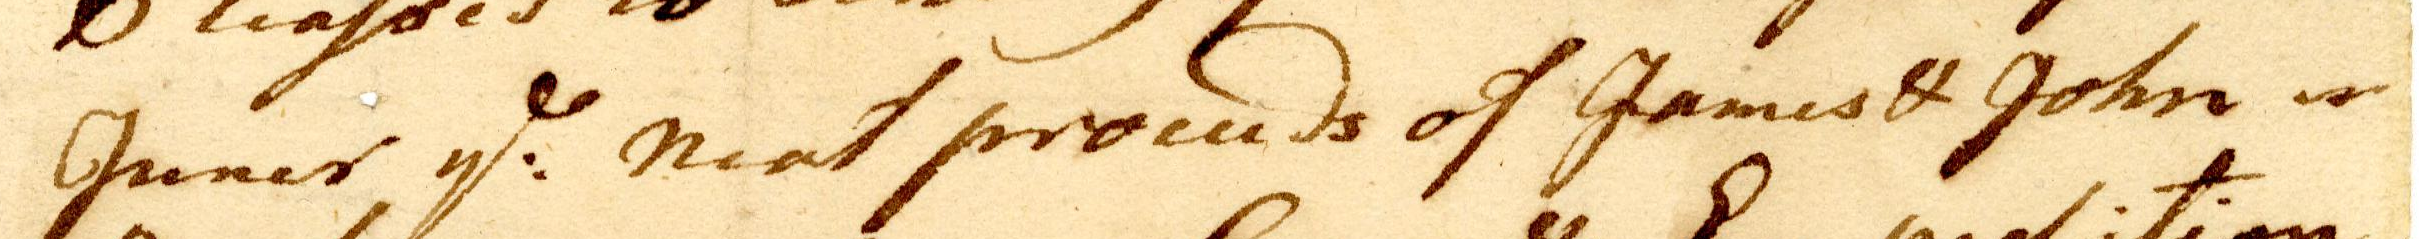Juner y^e. next proceeds of James & John in
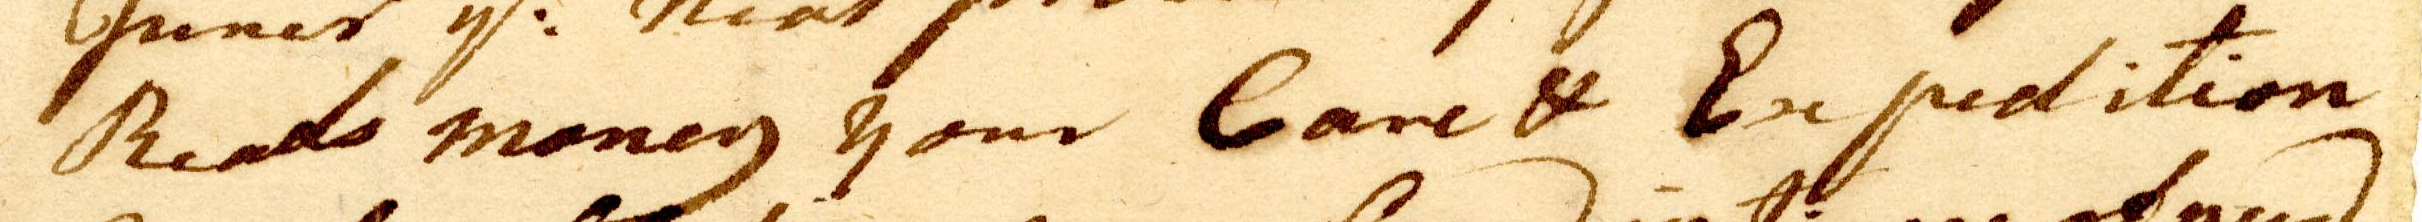Reads money your Care & Expedition
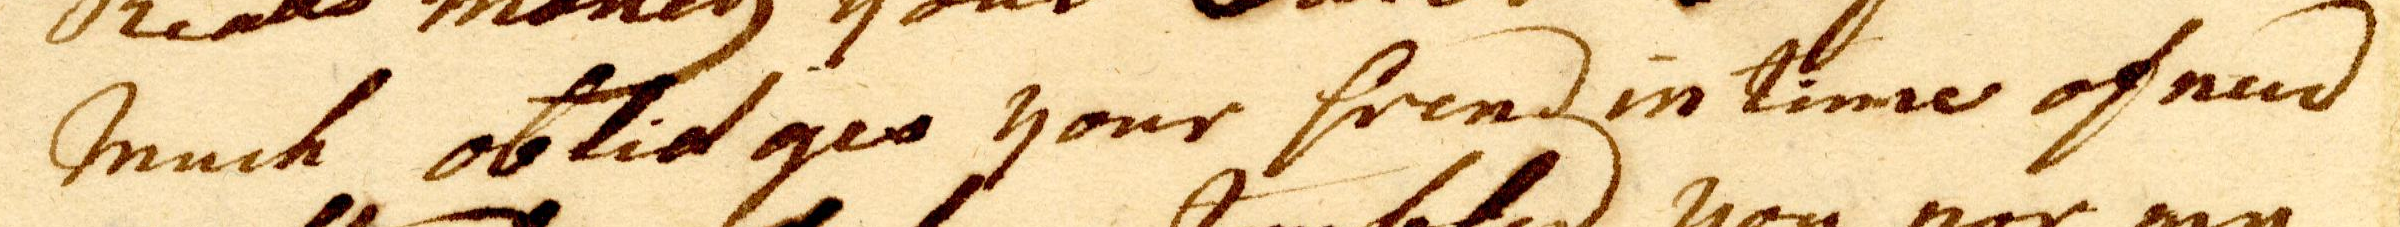much oblidges your frend in time of need
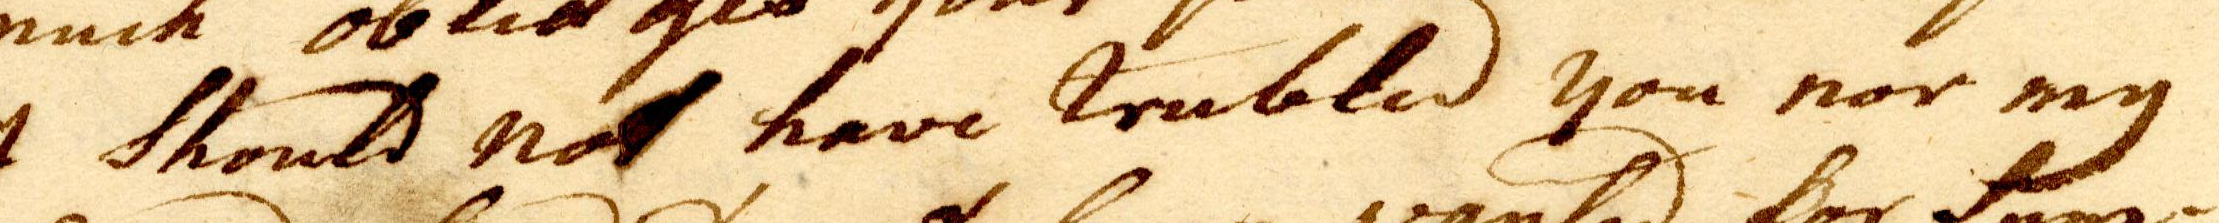should not have trubled you nor my
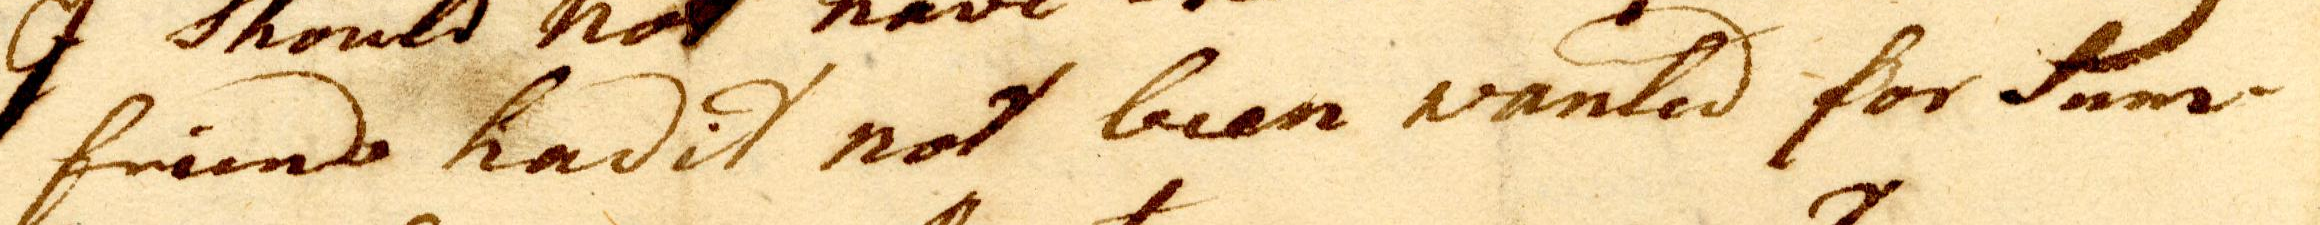friend had it not been wanted for Sum-
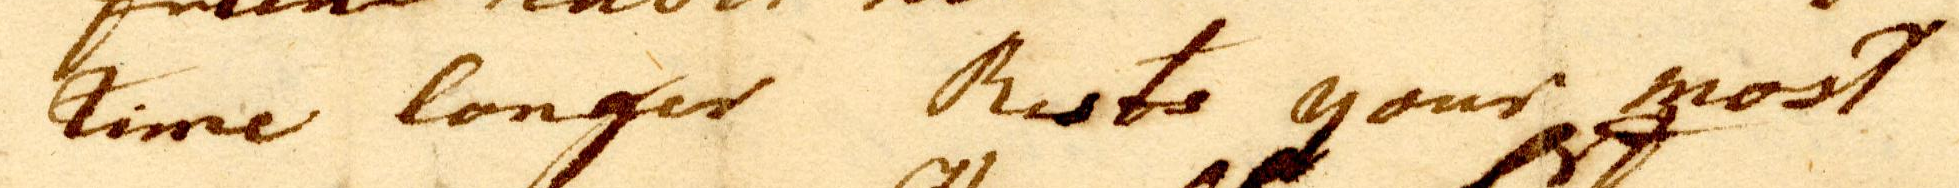time longer Rests your most
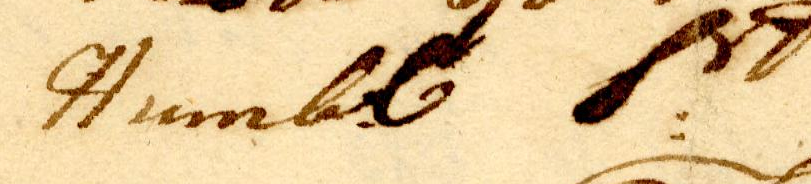Humble S^nt
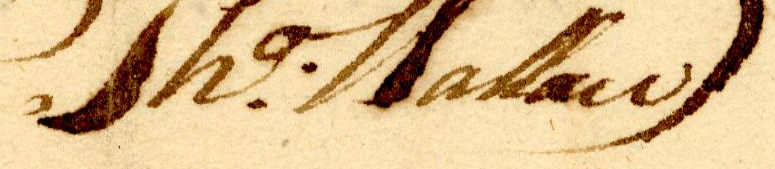Th^o. Wallace
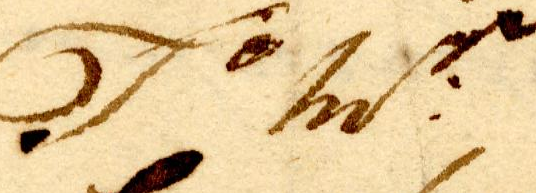T^o W^m:
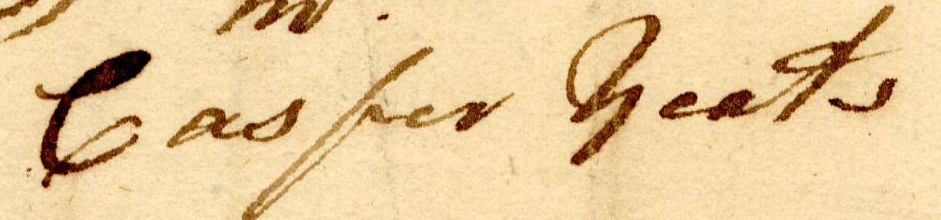Casper Yeats
